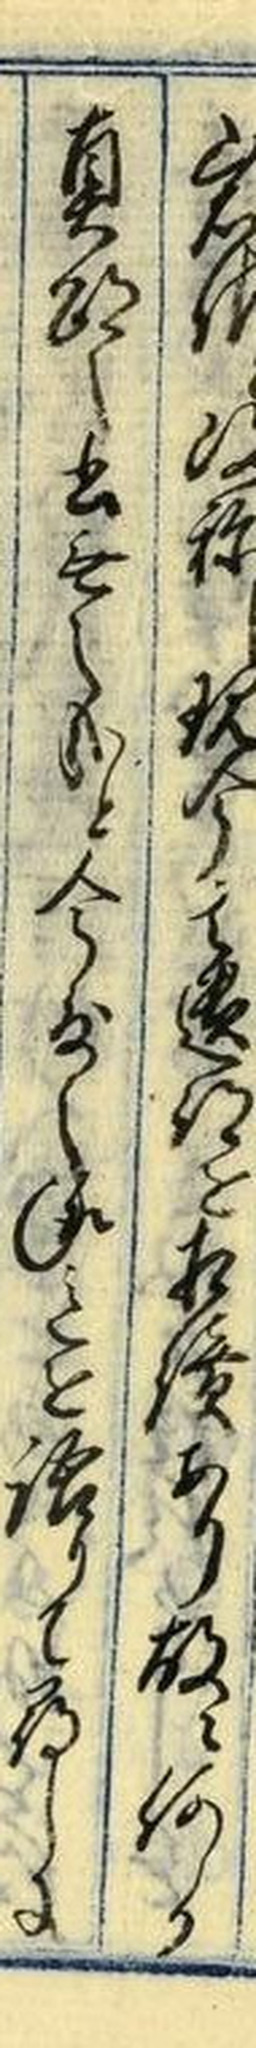真跡之書無之哉と今度之趣意を語りて尋しに
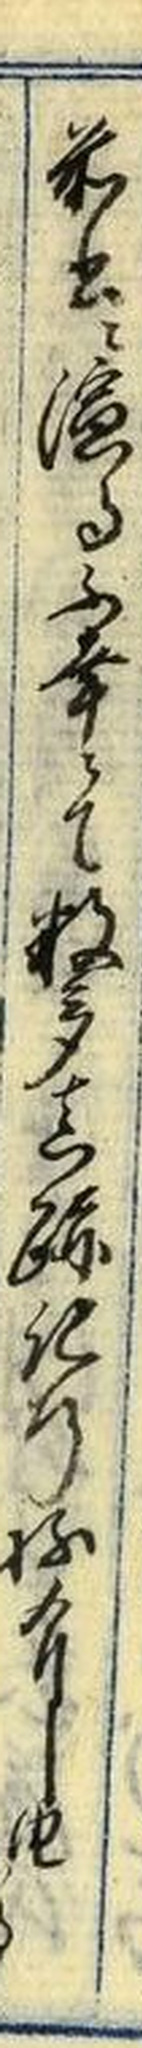前書に演る不幸にて数多真跡紀行抔有し由なるも
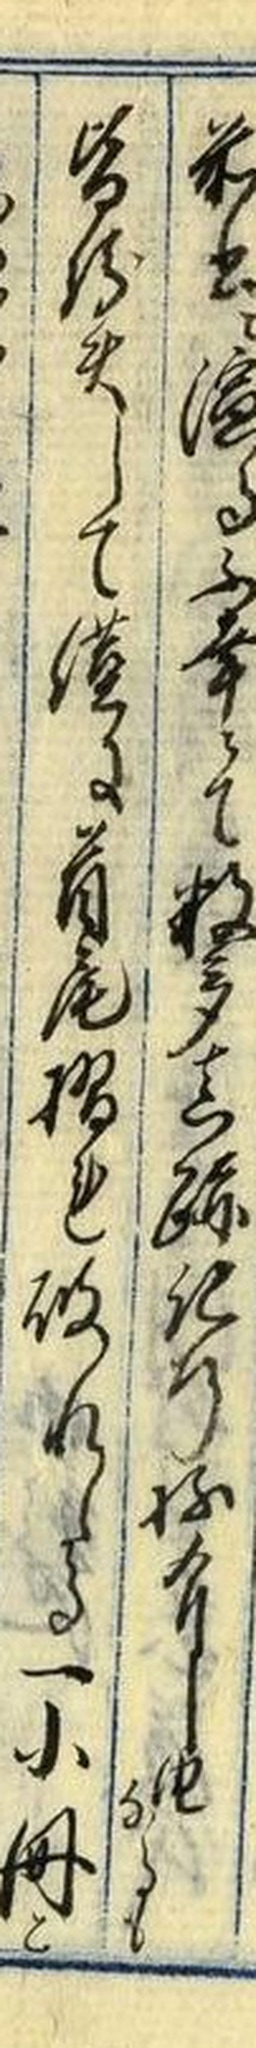皆紛失して僅に首尾摺れ破れたる一小冊と
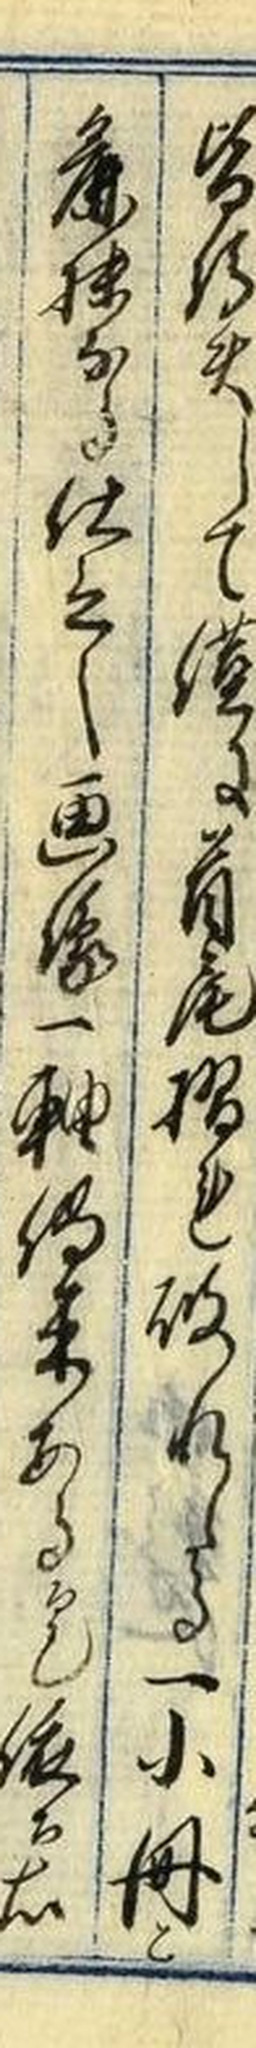麁抹なる仕立之画像一軸伝来ある而已依而右
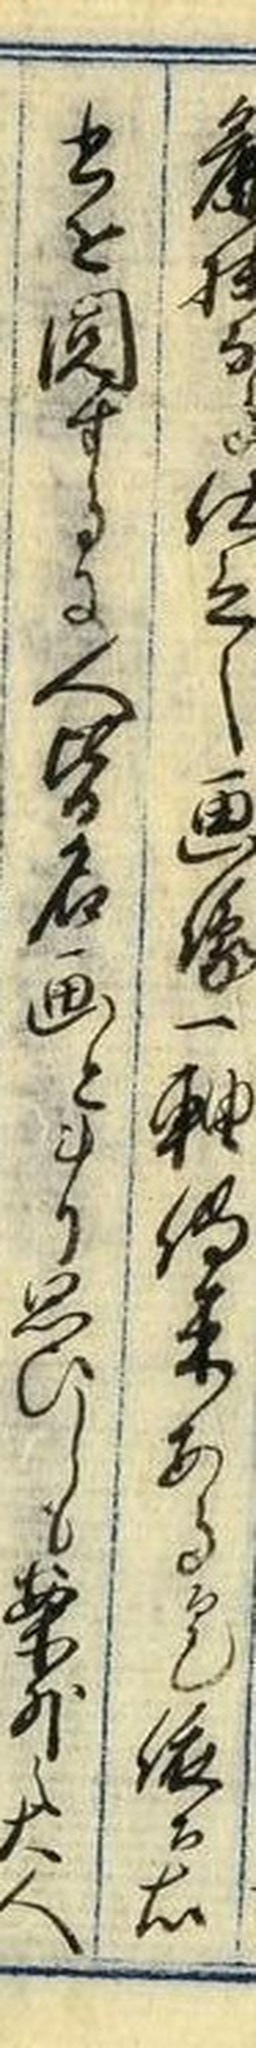書を閲するに人皆名画と計り思ひしも案外之大人
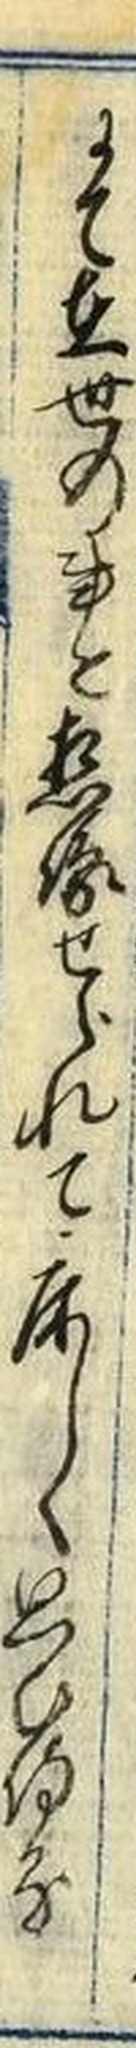にて在世の事を想像せられて床しく思ひ伝る

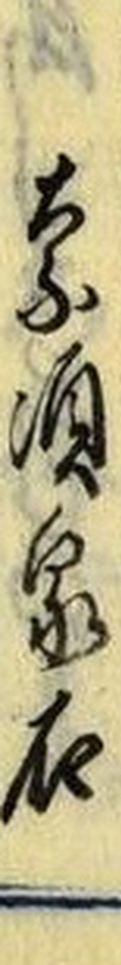奈須泉石
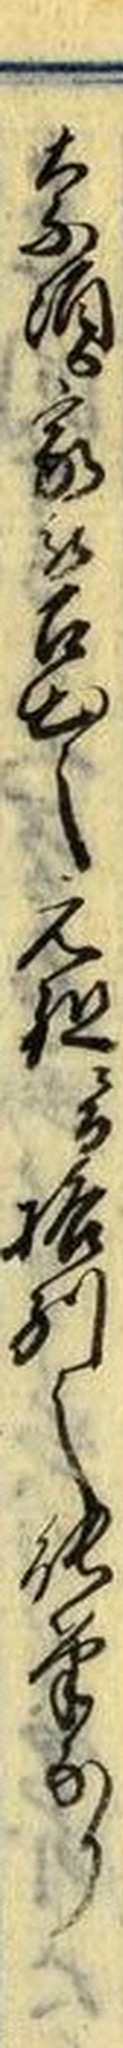奈須家被召出之元祖に而格別之能筆なり
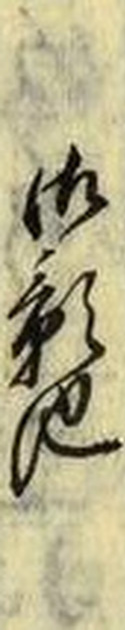御頼池
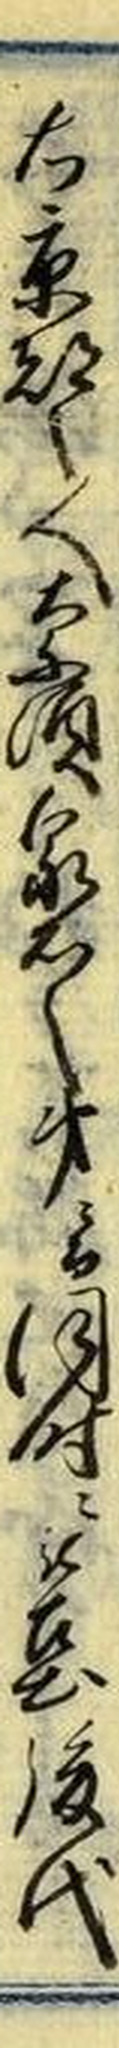右京都之人奈須泉石之弟に而同時に被召出後代
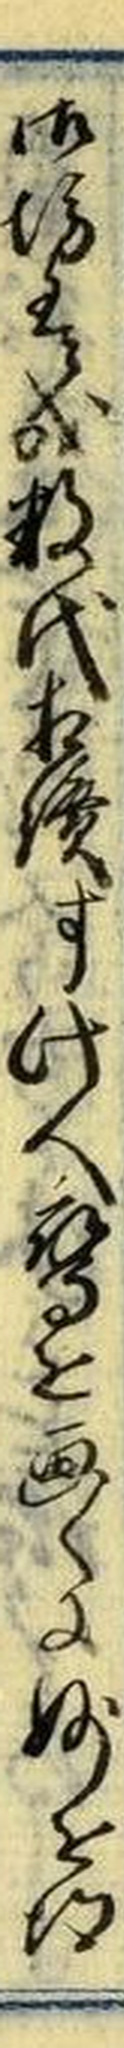御坊主に成数代相続す此人鷹を画くに妙を得
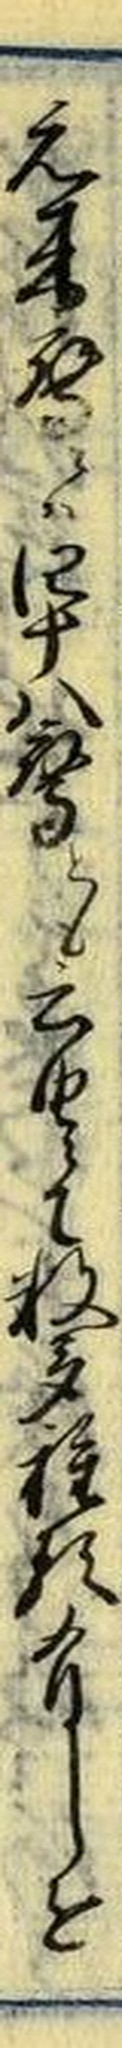元来鷹には四十八鷹とも云由にて数多種類有しを
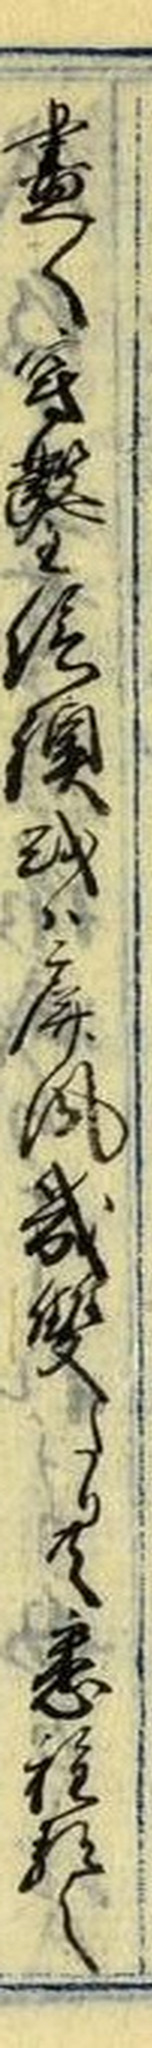尽く穿鑿絵襖或は屏風幾雙たり共悉種類之
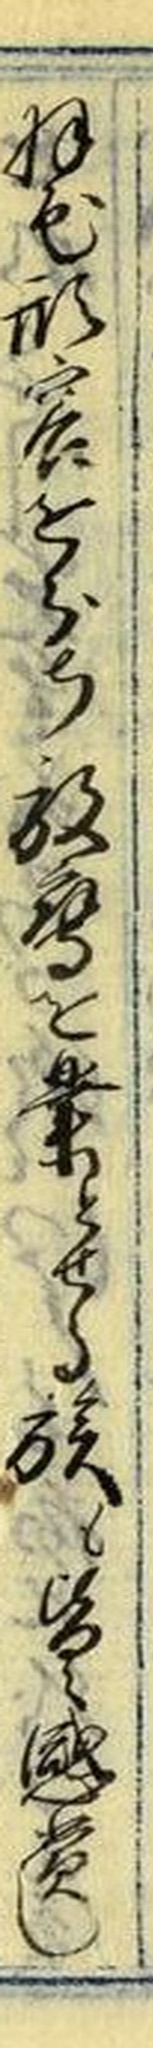羽毛形容を分ち放鷹を業とせる族も皆々感賞也
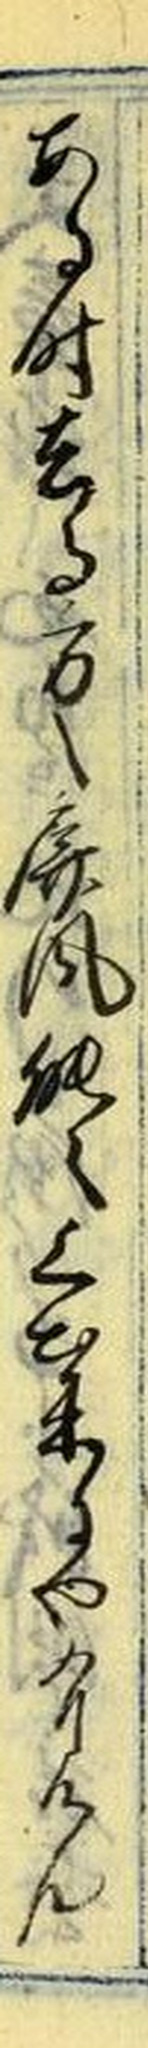ある時去る方之屏風能々上出来にや有けん
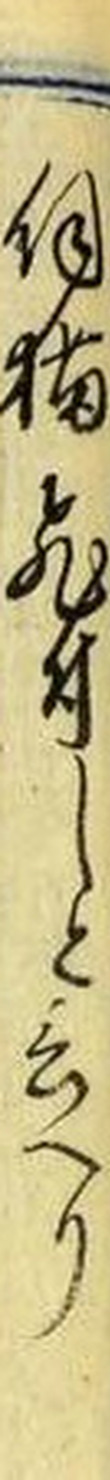飼猫飛付しと言へり
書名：温古集 四巻
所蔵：福井県文書館 Fukui Prefectural Archives
